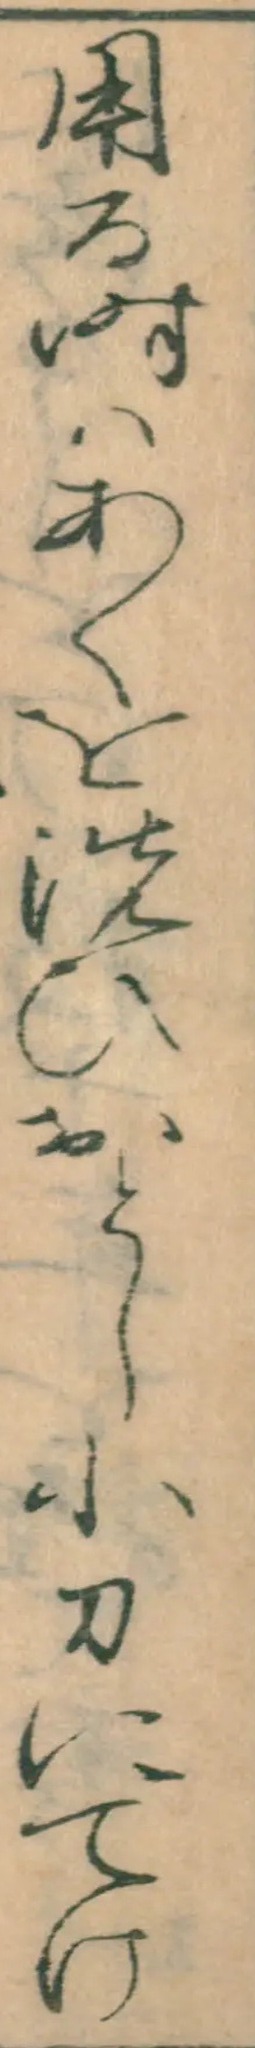用る時はあくを洗ひおとし小刀にてけ
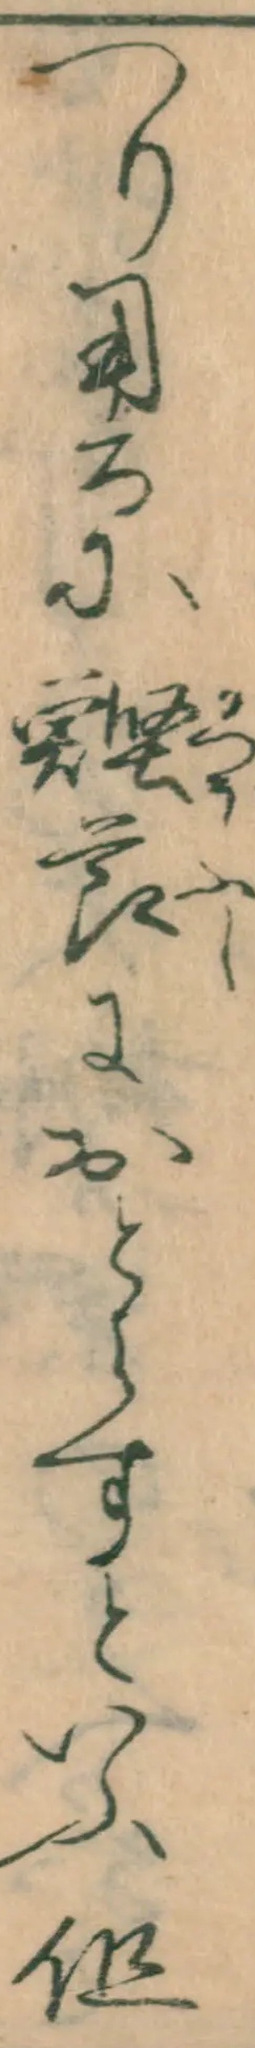つり用るに鰹節におとらすといふ但
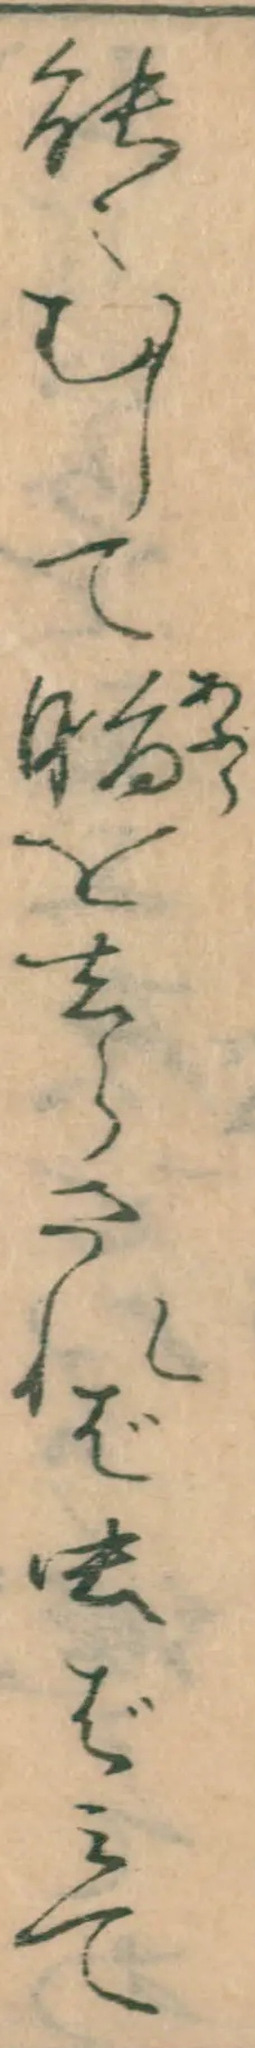能々むして脂を去らされば虫ばみて
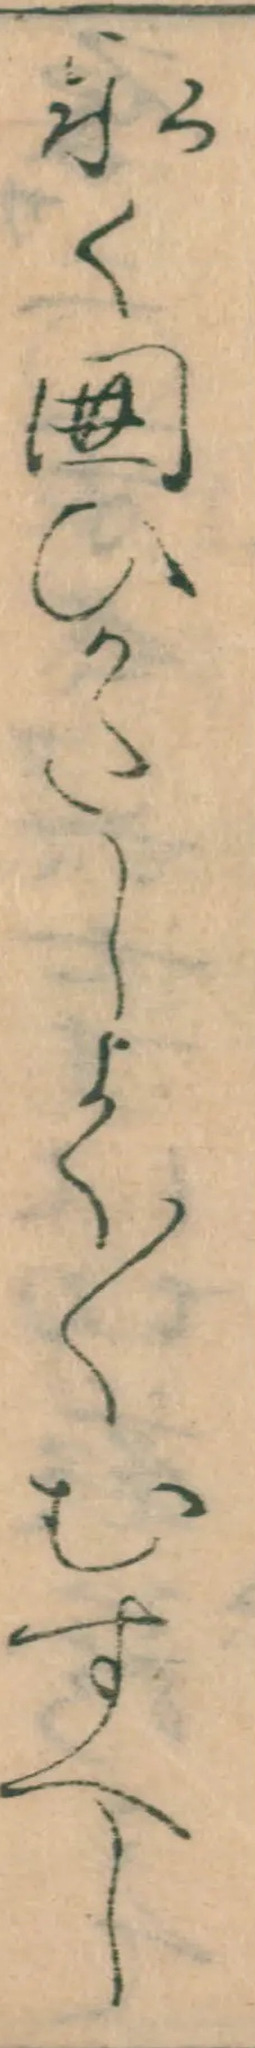永く囲ひかたしよく〳〵むすへし
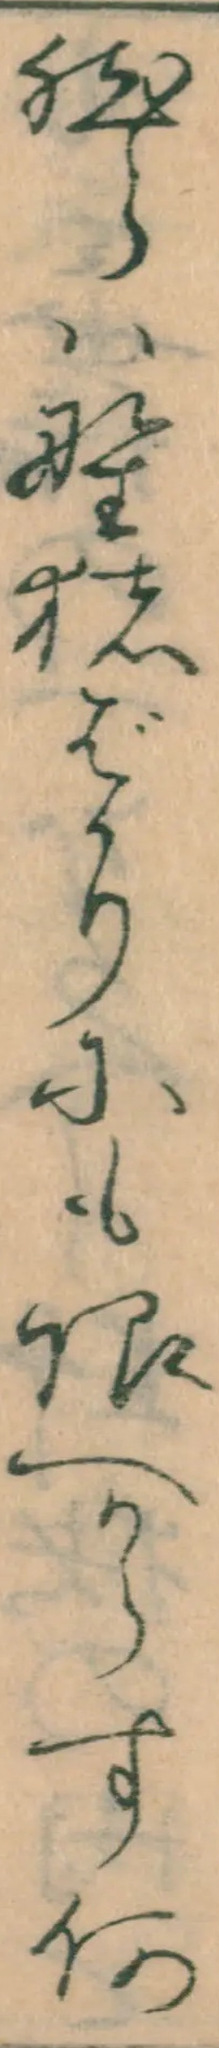然らは野猪ばかりにも限へからす何
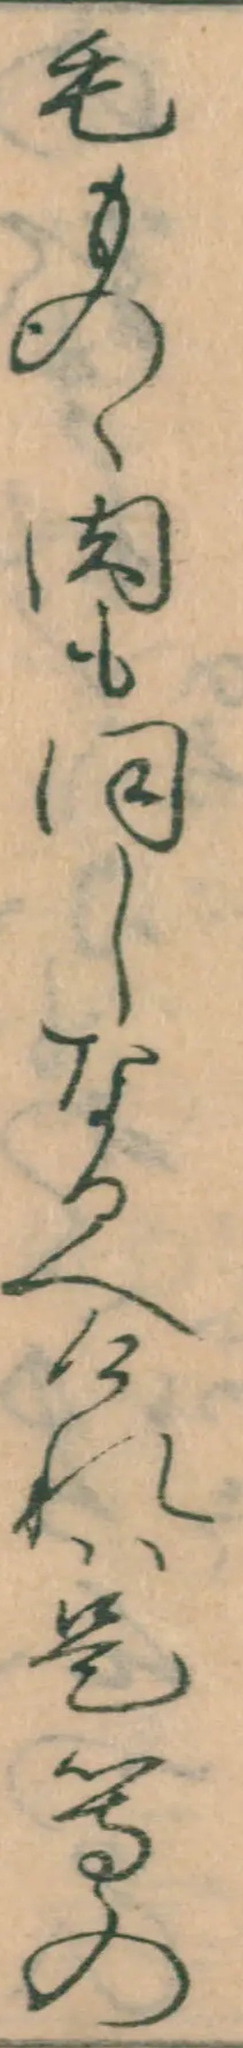毛ものゝ肉も同しなるへけれは是等の
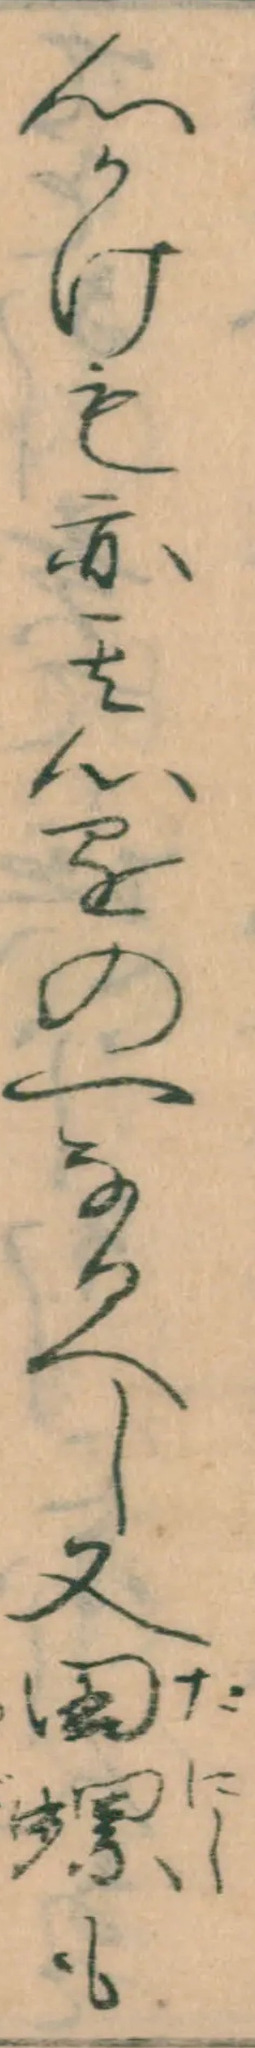心かけも亦其心懸の一なるへし又田螺も
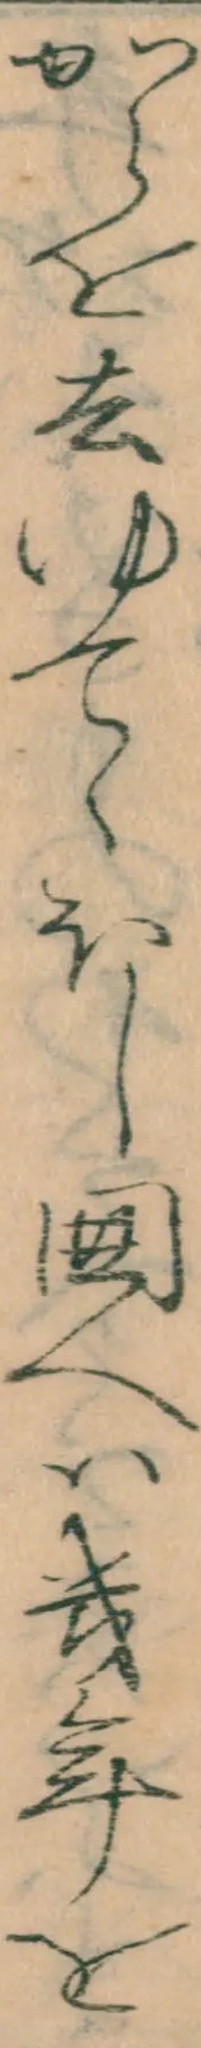からを去ゆてゝほし囲へは幾年を
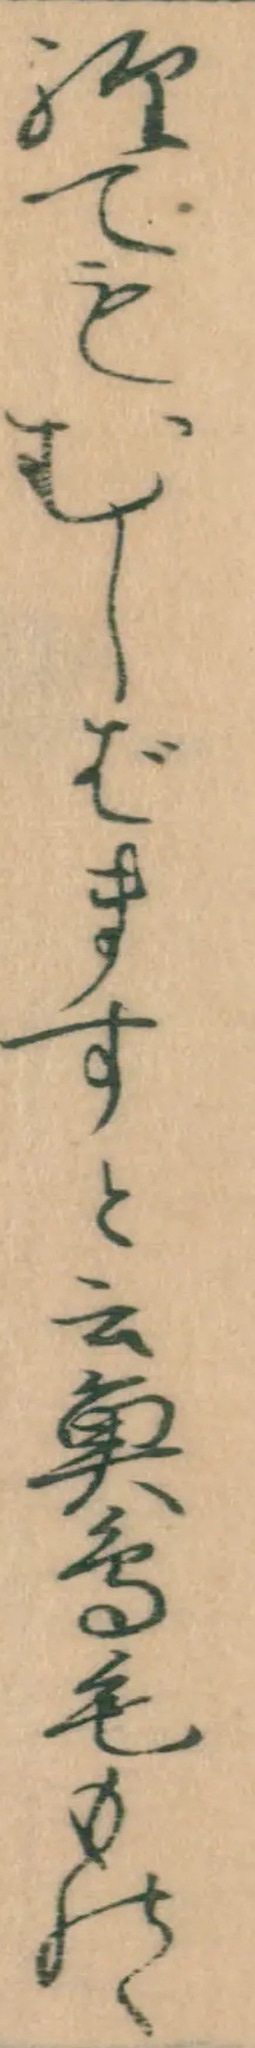経てもむしばますと云魚鳥毛ものゝ
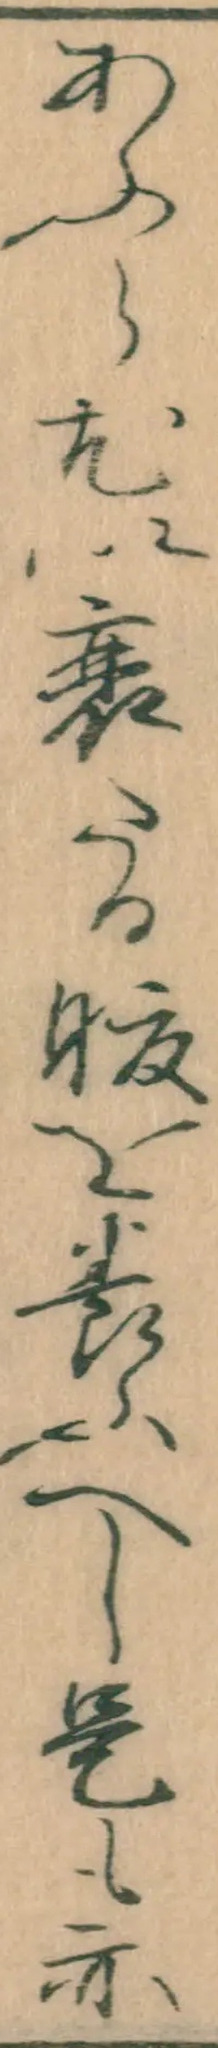あふら尤以衰たる腹を養ふへし是も亦
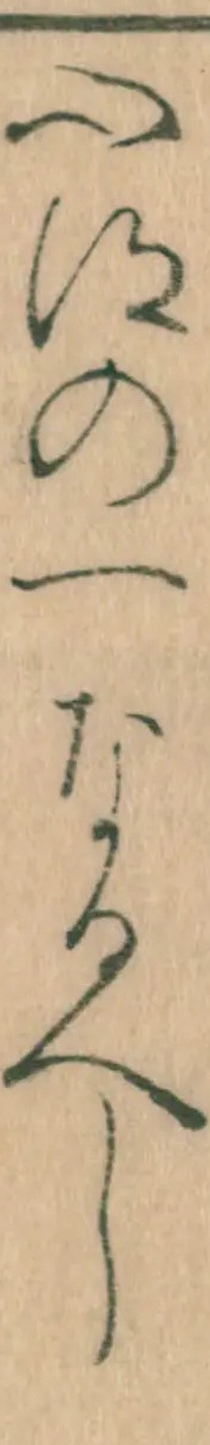心得の一なるへし
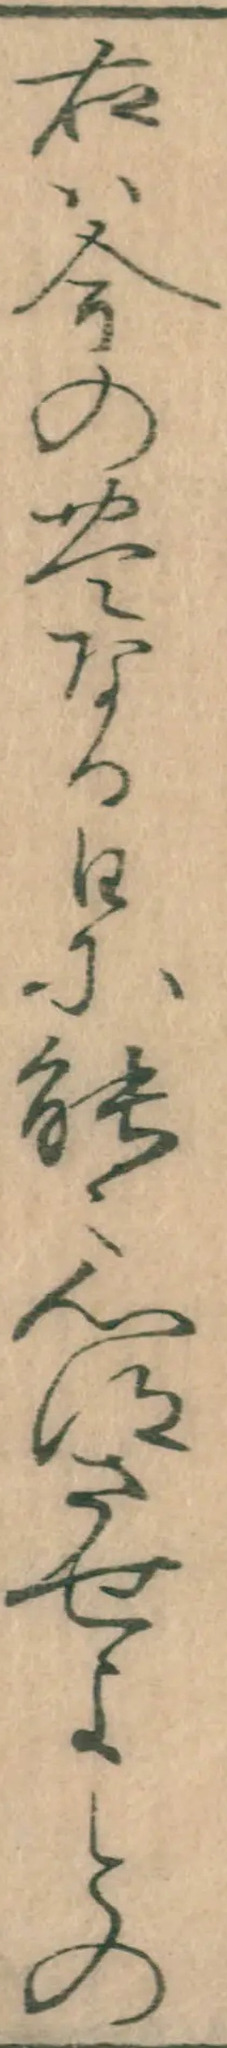右は今の豊なる日に能々心得させよとの
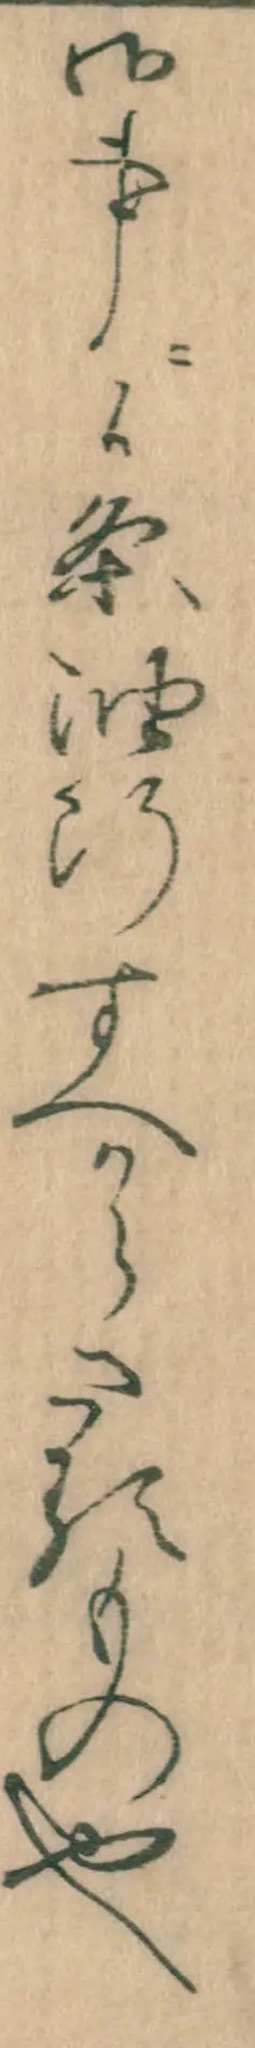御事に候条油断すへからさるもの也
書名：かてもの
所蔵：国立国会図書館 National Diet Library, JAPAN
